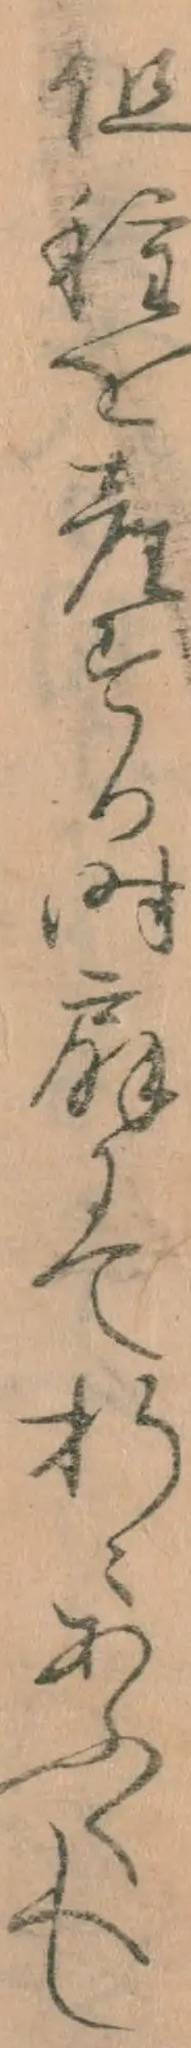但種を産する時扇にて折々あふくへし
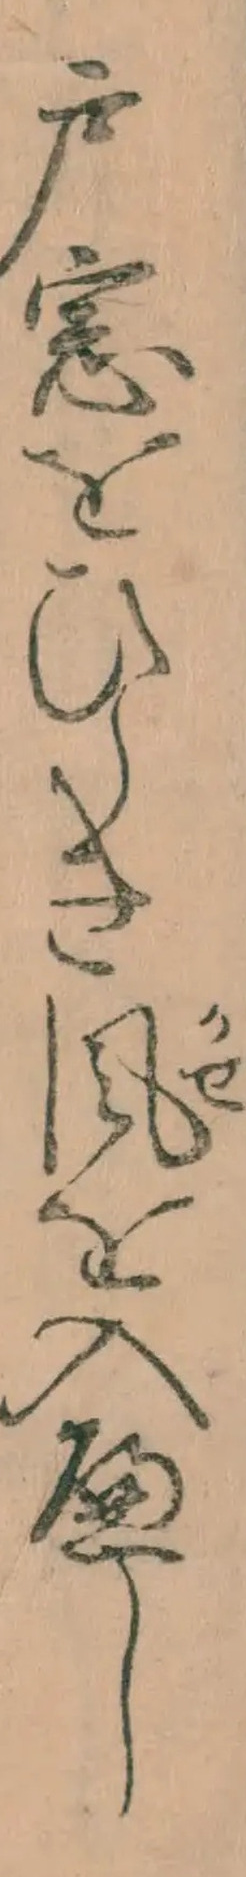戸窓をひらき風を入へし
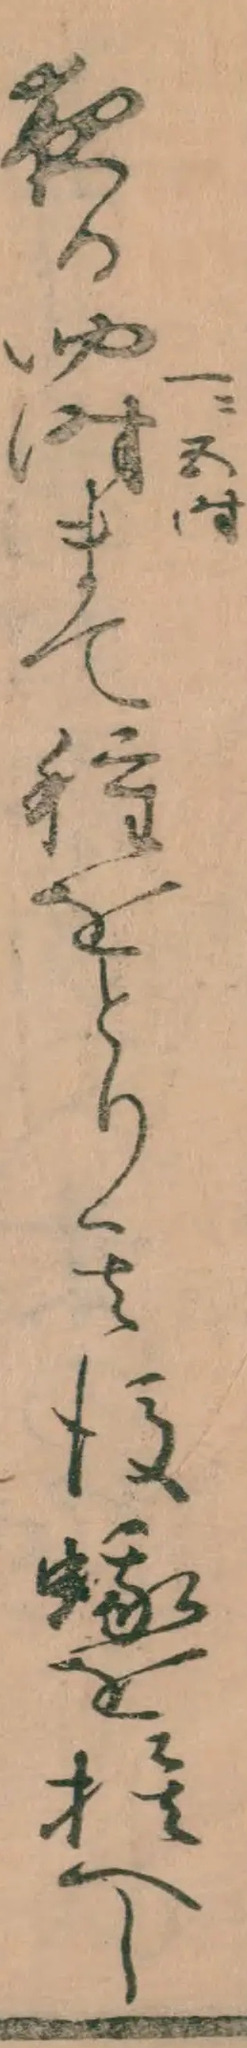一夜る四時まて種をとり其後蛾を捨へし
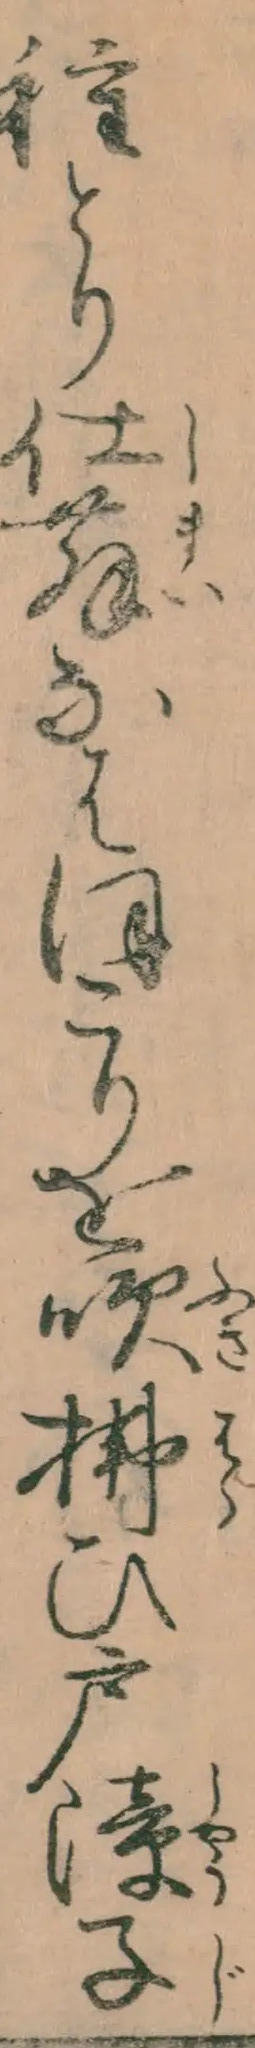種とり仕舞なはほこりを吹払ひ戸障子
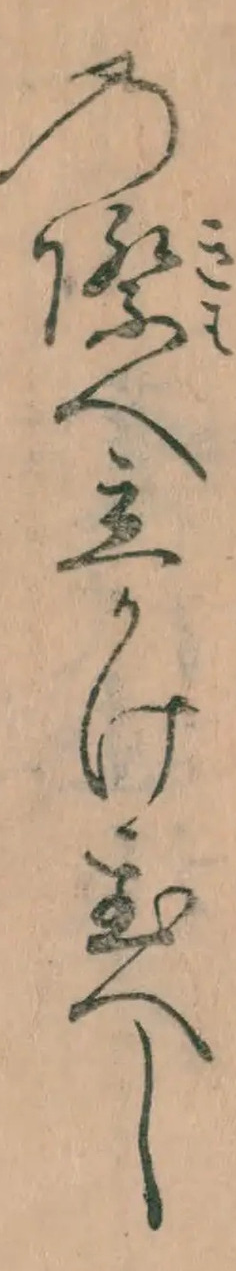の際へ立かけ置へし
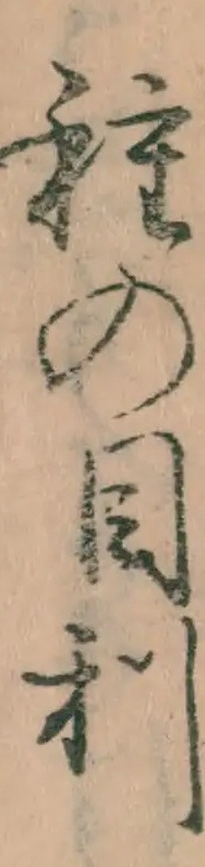種の目利
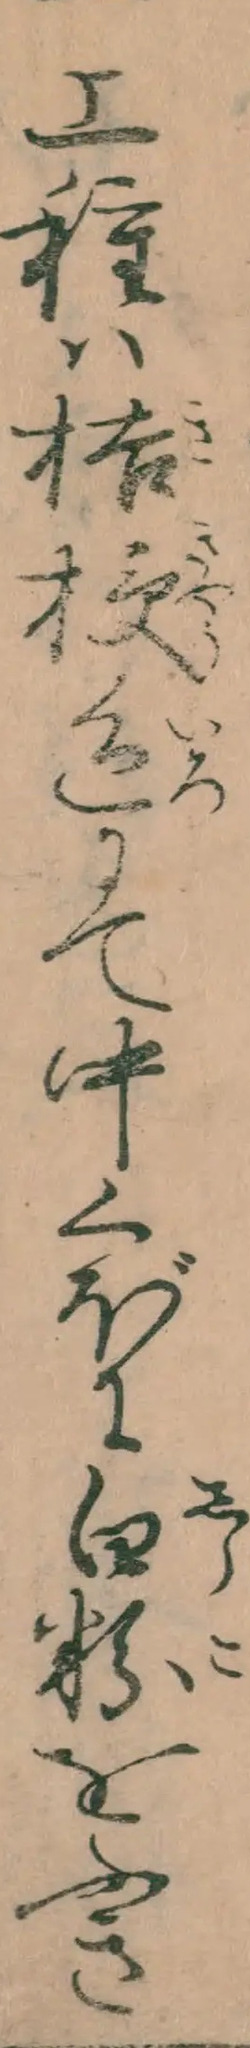一上種は桔梗色にて中くぼに白粉をふき
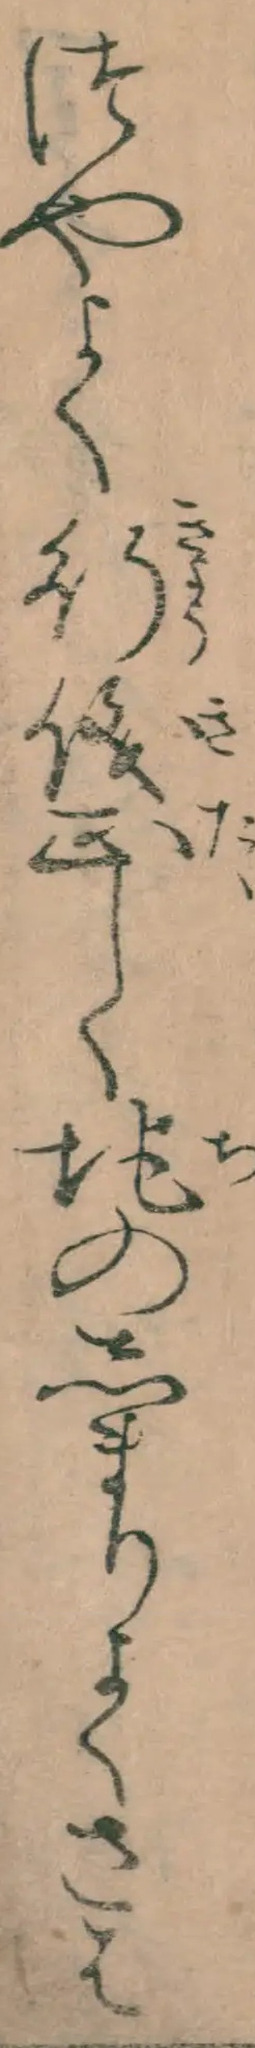つやよく行儀正しく地のしまりよくさは

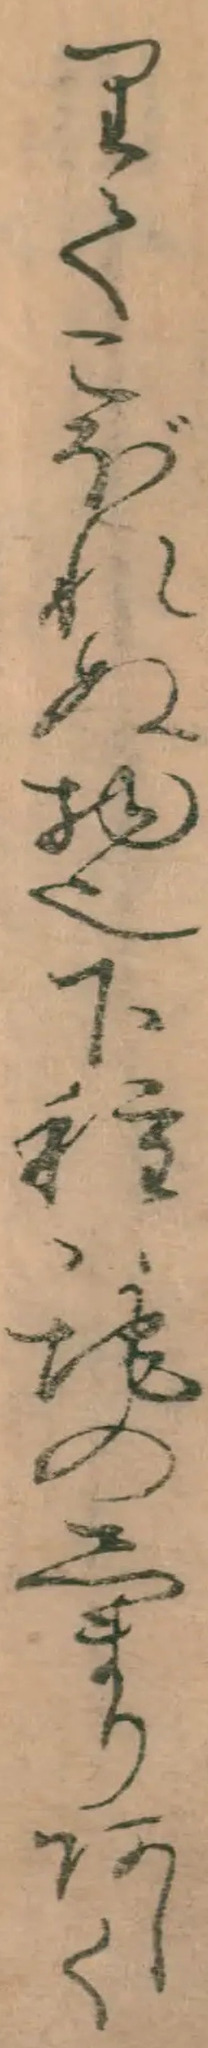りてこぼれぬ物也下種は地のしまりあしく
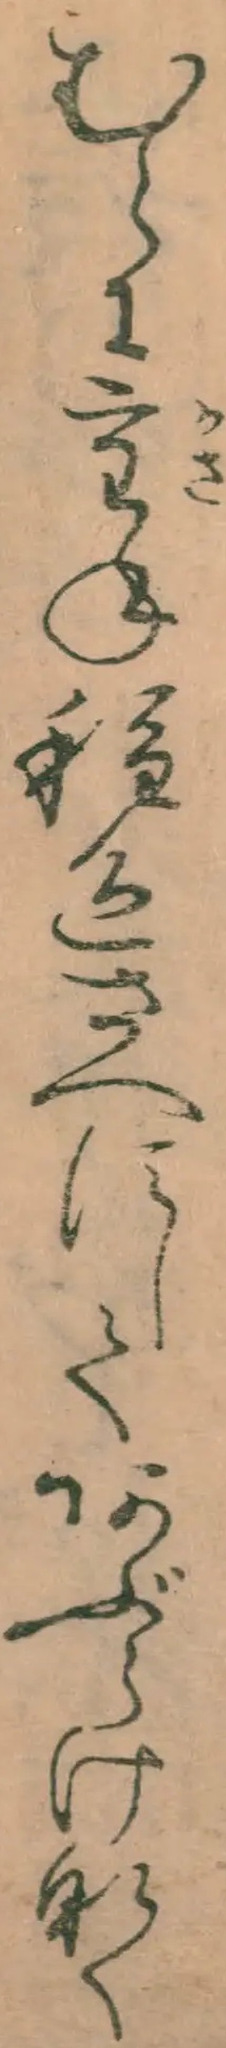むらに重ね種色さへすしてあぶらけなく
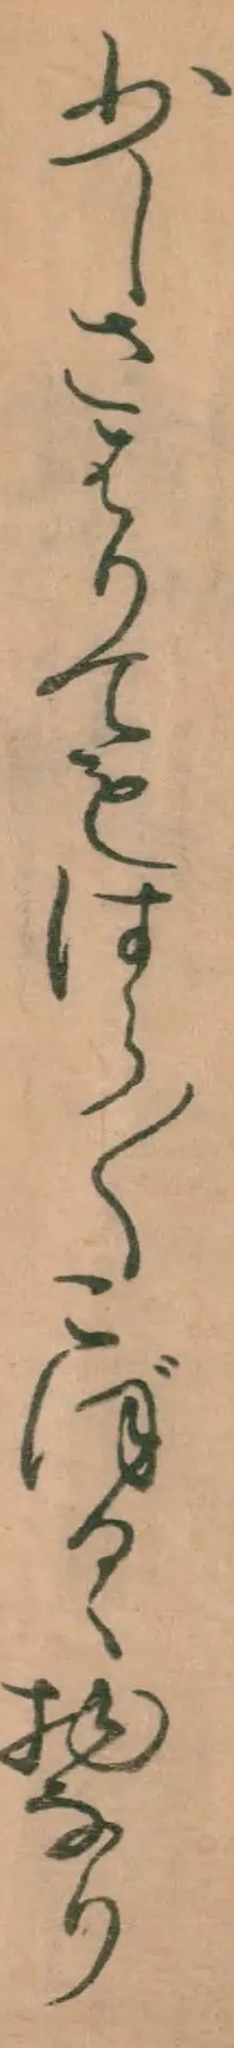少しさはりてもはら〳〵こぼるゝ物なり
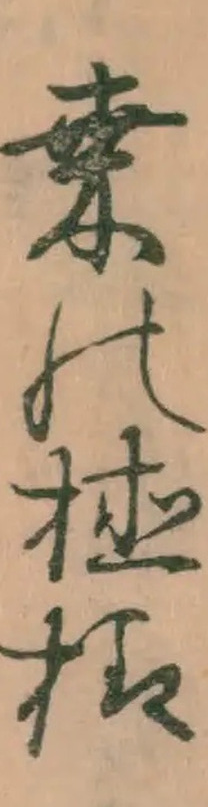桑の植様
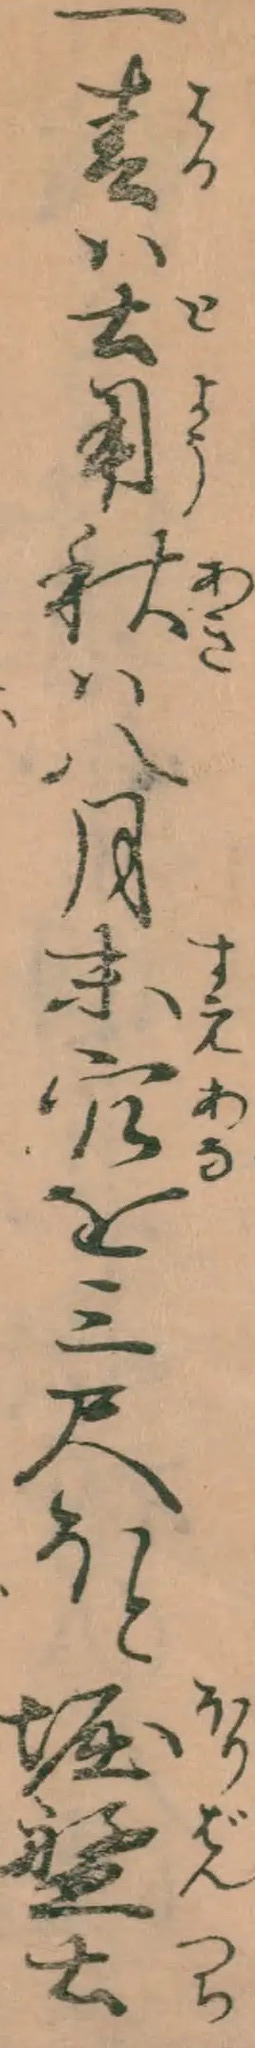一春は土用秋は八月末穴を三尺ほと堀盤土
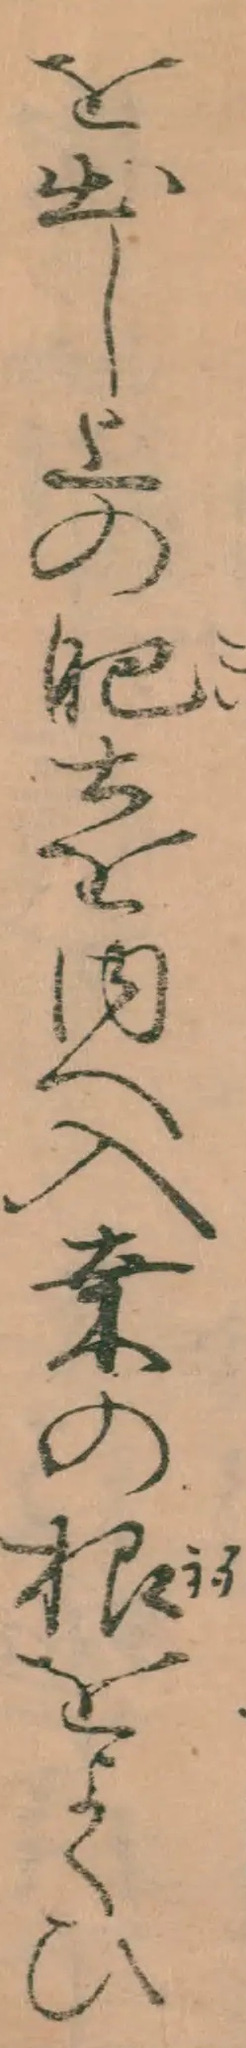を出し上の肥土を内へ入桑の根をよくひ
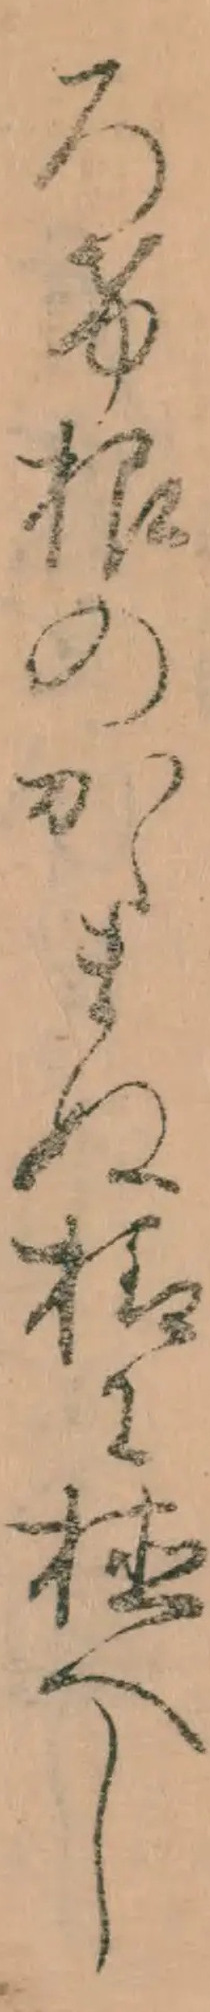ろけ根のからまぬ様に植へし
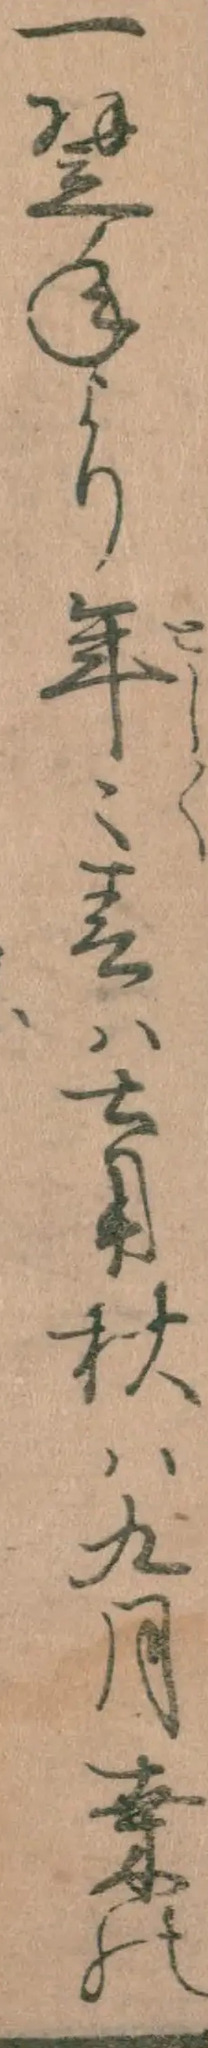一翌年より年々春は土用秋は九月桑の
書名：養蚕手引
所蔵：国立国会図書館 National Diet Library, JAPAN
